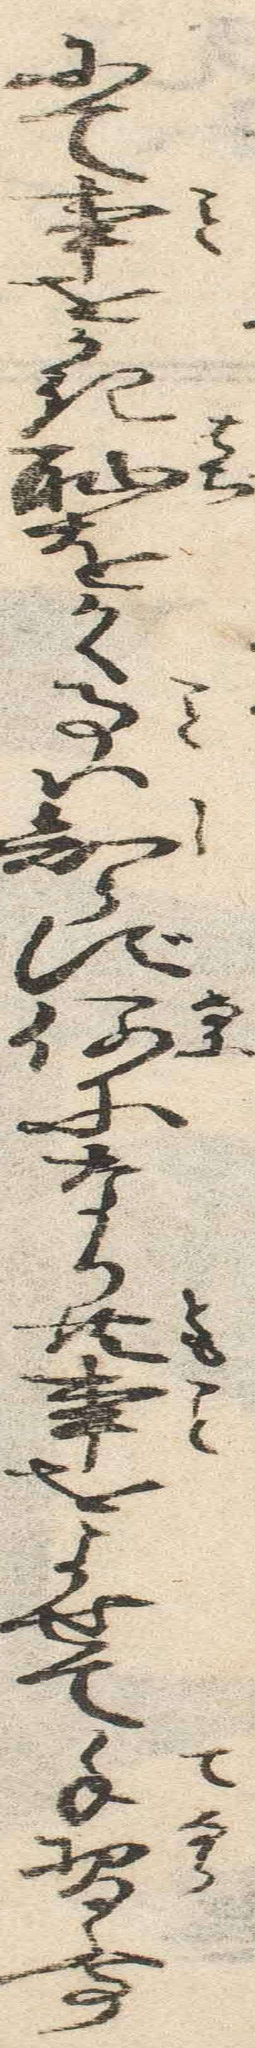にて事をかき恥をかく事は知らず何になり共事をよせて手習ふ事
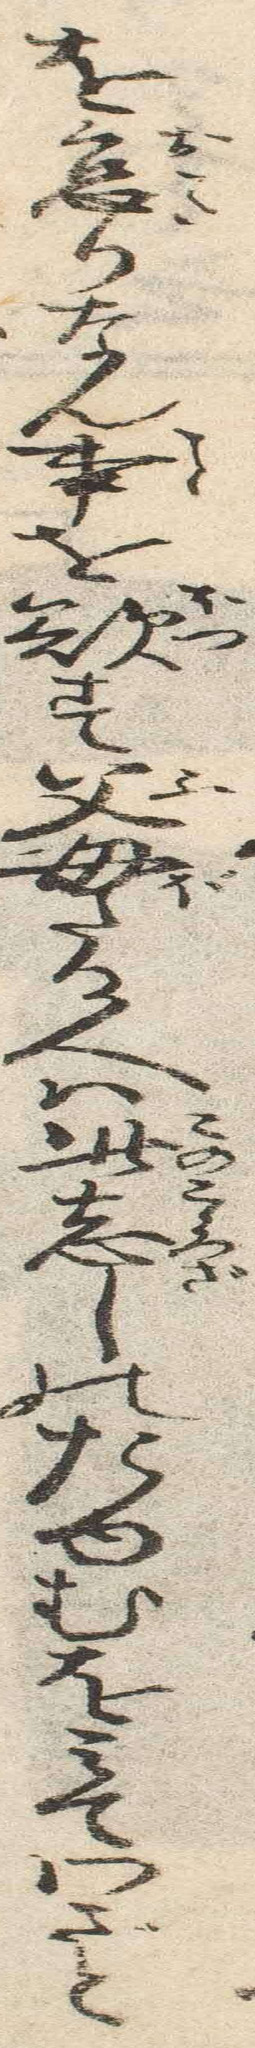を怠りなん事を欲す父母たる人は此志しのたゆむをみてわざと
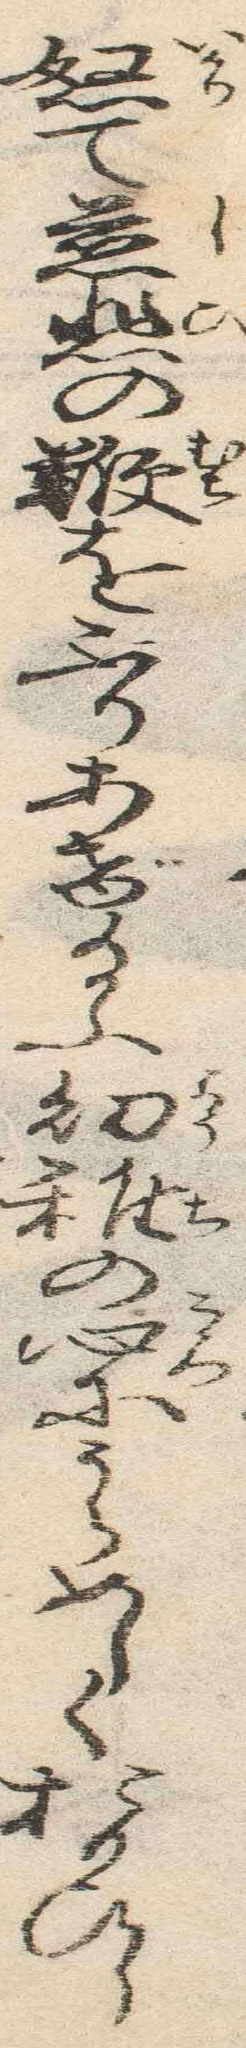怒て慈悲の鞭をふりあげ給ふ幼稚の心にうらめしくおもひし
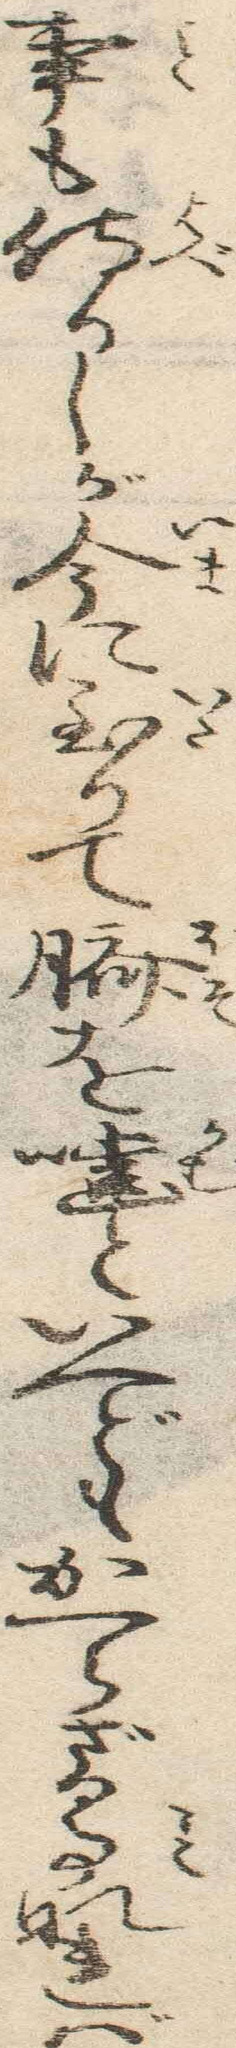事も侍りしが今に至りて臍を噛といへどもかへらざる事なれば
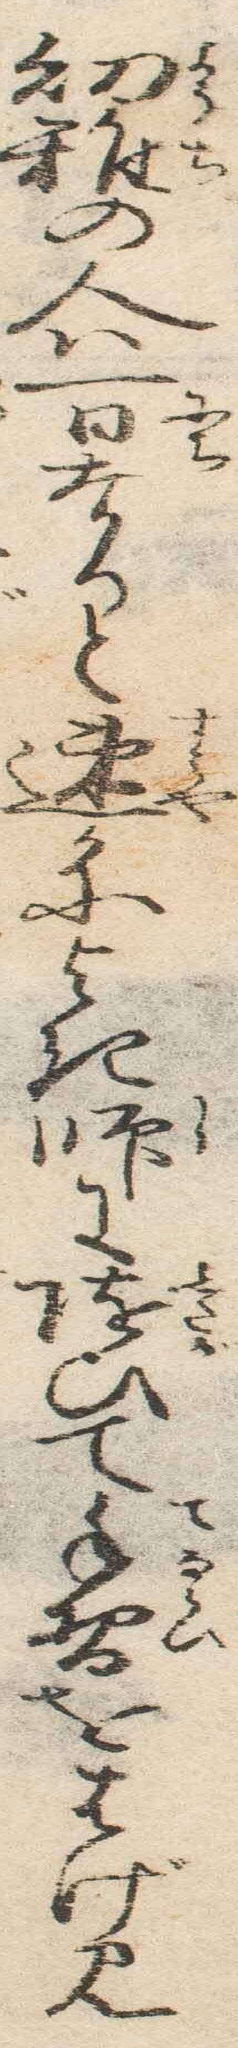幼稚の人は一日なりと速かによき師に随ひて手習をはげみ
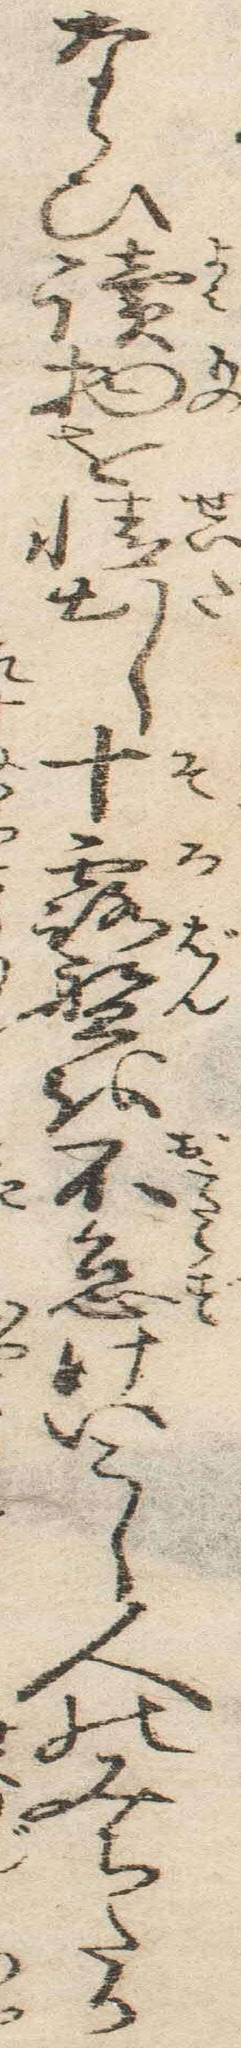ならひ読物を情出し十露盤を不怠けいこし人のみちたり
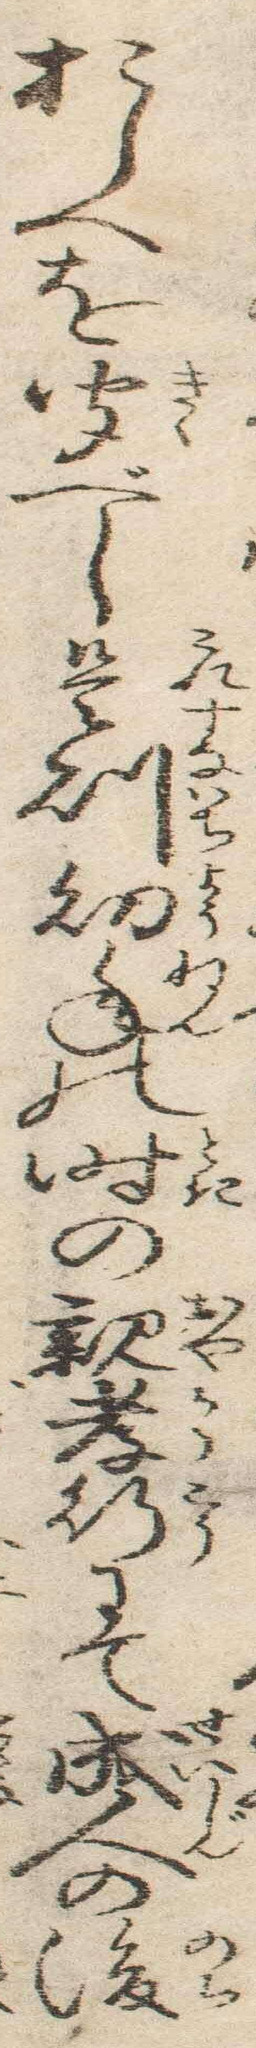おしへを聞べし是則幼年の時の親孝行にて成人の後
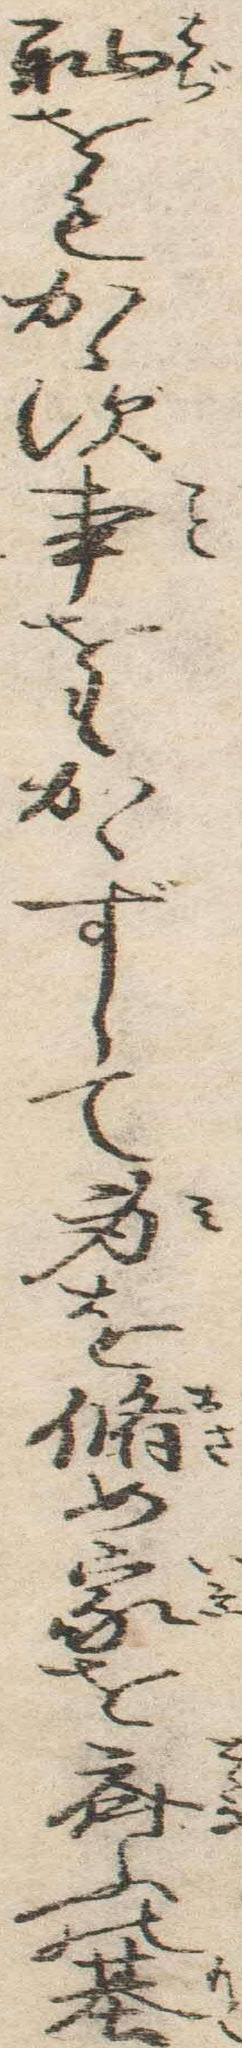恥をもかゝす事をもかゝずして身を脩め家を斉ふの基
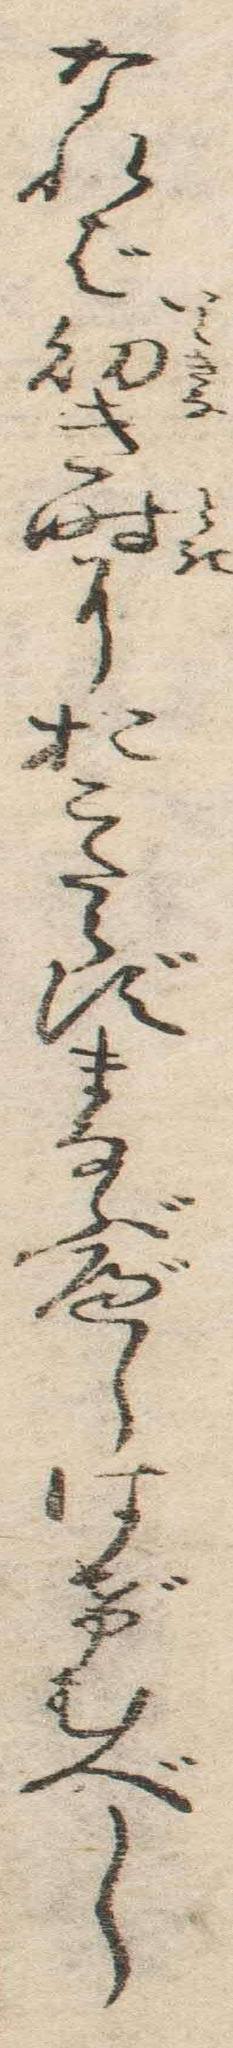なれば幼き時におこたらずまなぶべしはげむべし

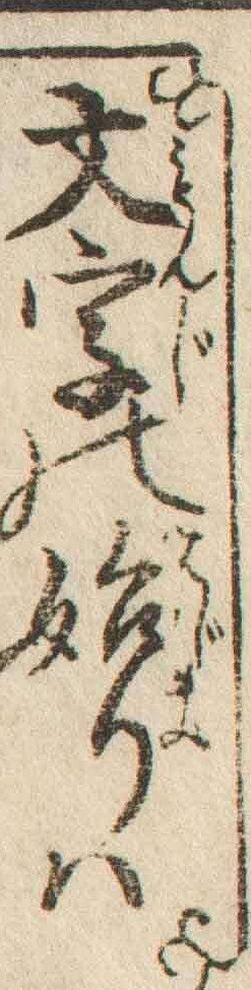文字の始りは
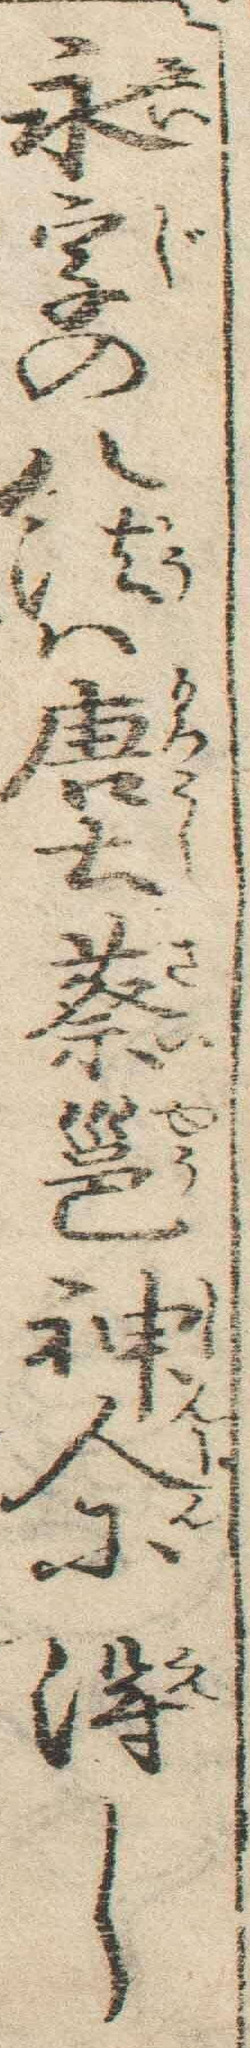永字の八法は唐土蔡邕神人に得し
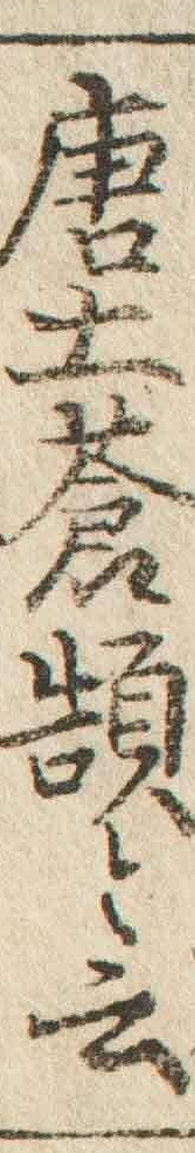唐土蒼頡と云
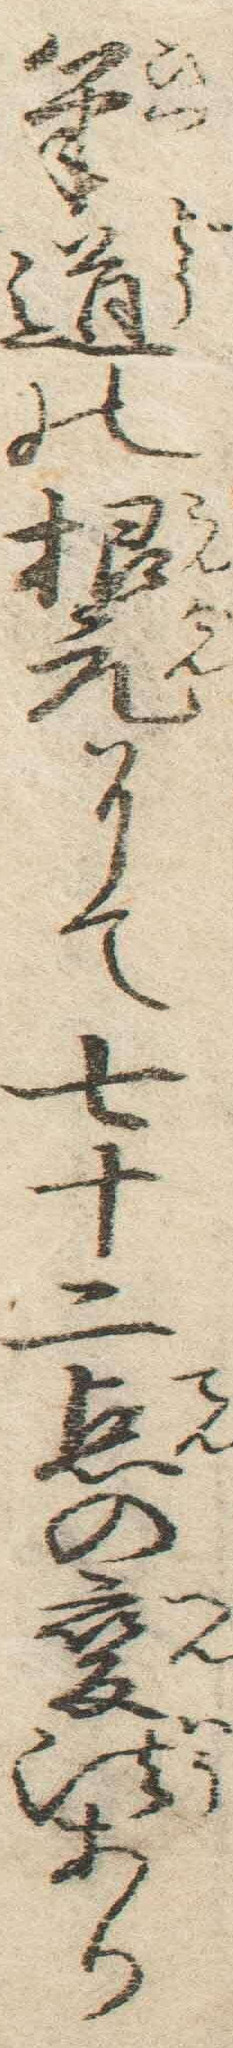筆道の根元にて七十二点の変法あり
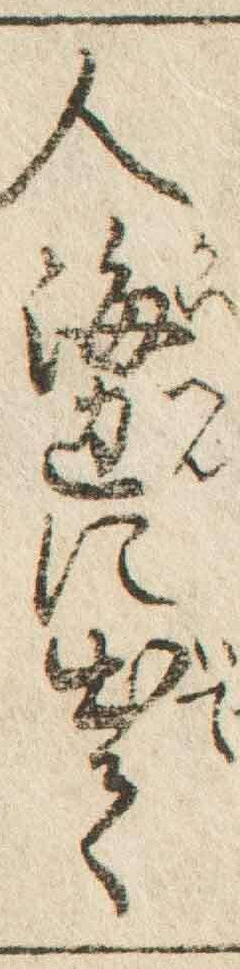人海辺に出て
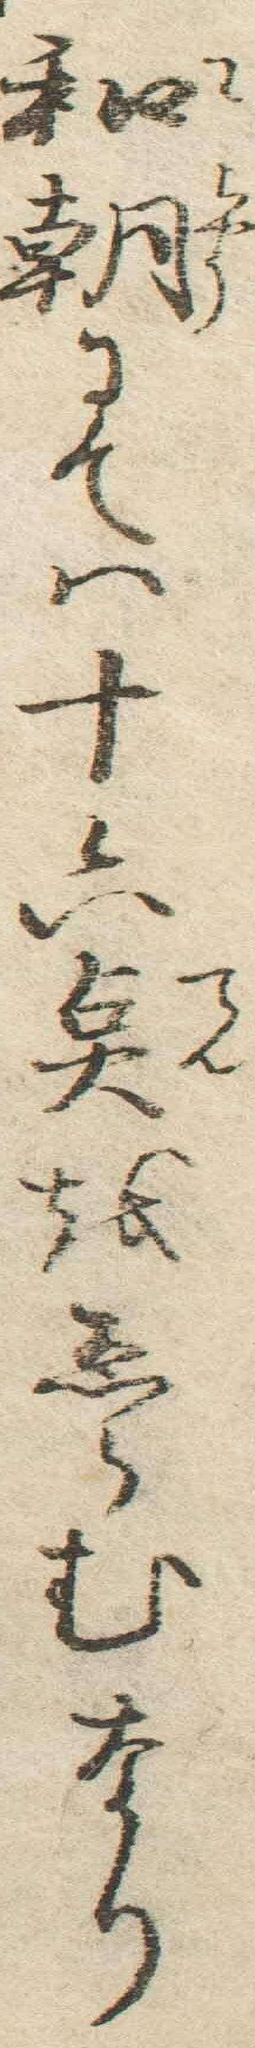和朝にては十六点をゑらむなり
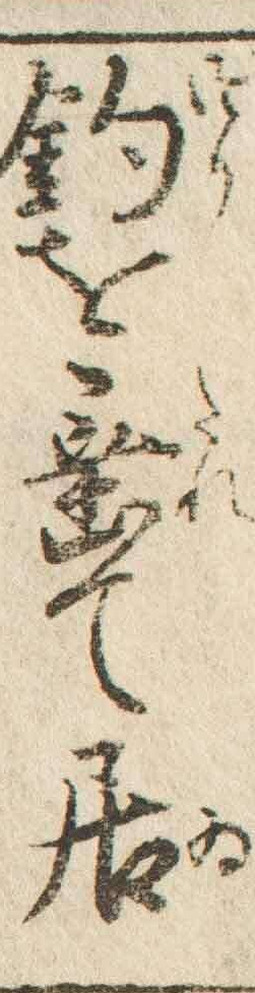釣を垂て居
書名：撫育草
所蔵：東京学芸大学附属図書館 国文学研究資料館
